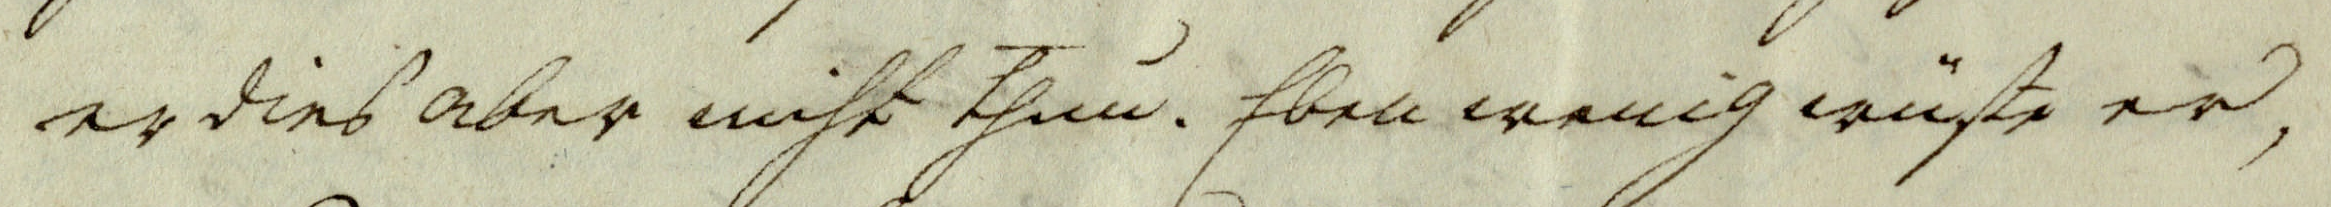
er dies aber nicht thun. Eben wenig wüsste er,
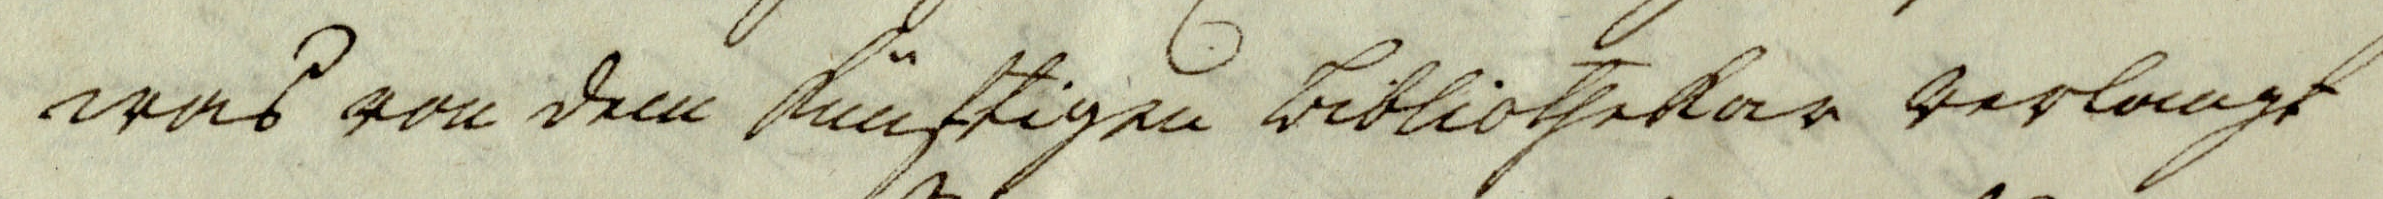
was von dem künftigen Bibliothekar verlangt
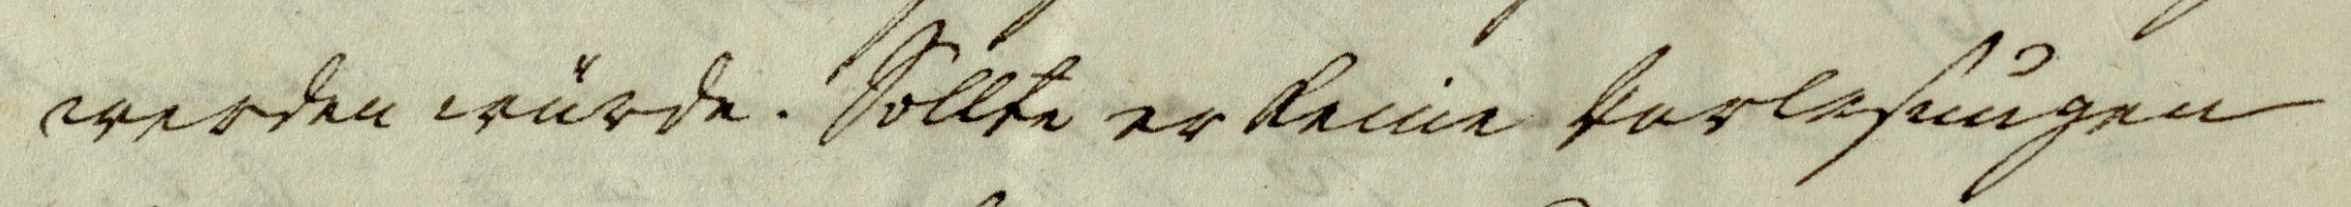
werden würde. Sollte er keine Vorlesungen
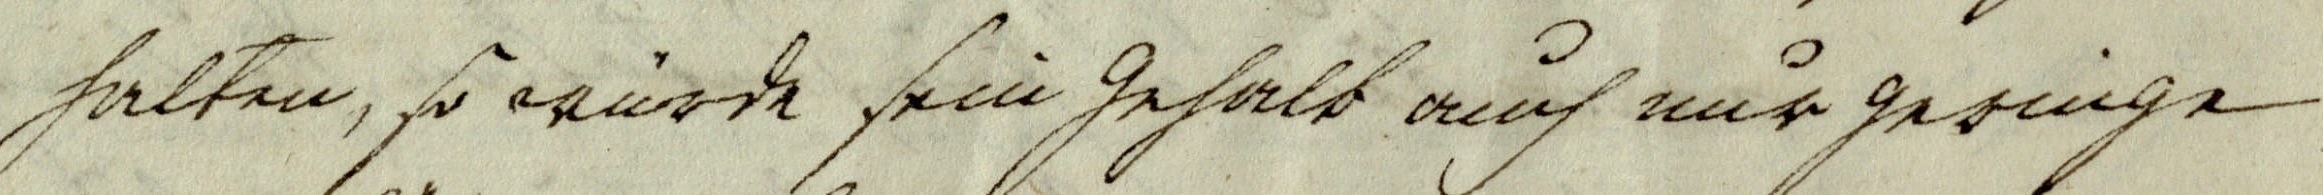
halten, so würde sein Gehalt auch nur geringe
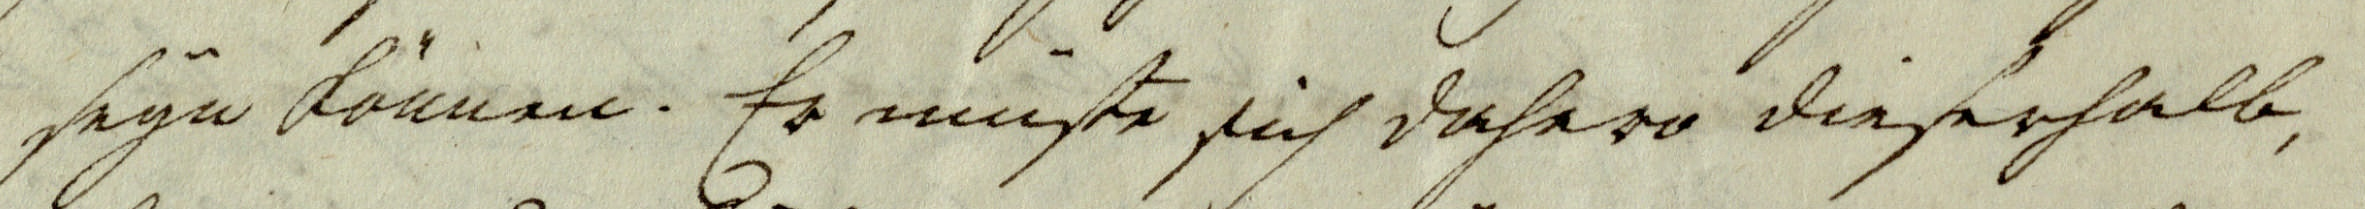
seÿn könne. Er müsste sich dahero dieserhalb,
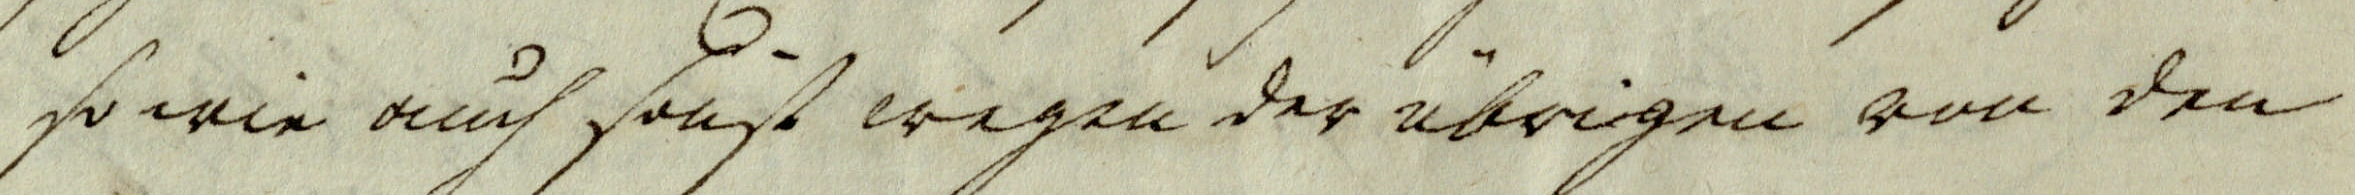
so wie auch sonst wegen der übrigen von den
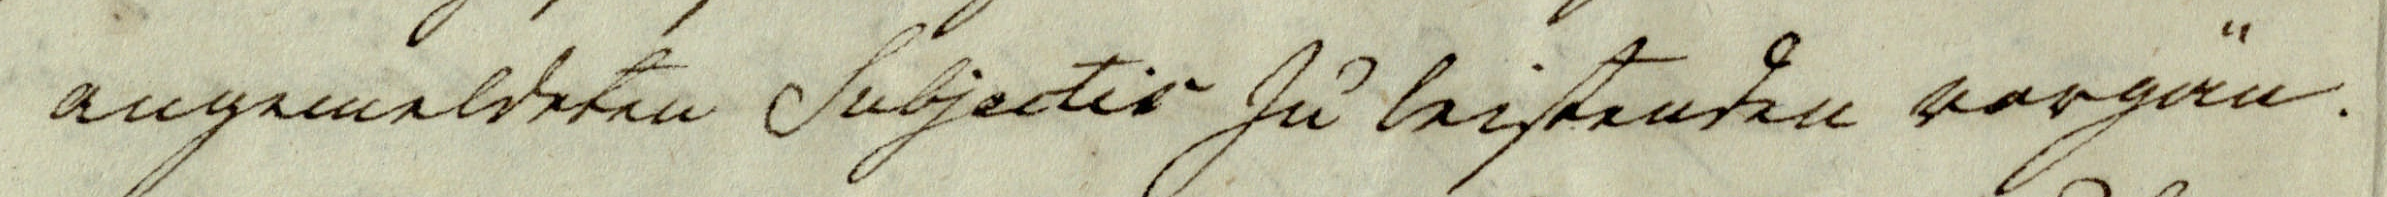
angemeldeten Subjectis zu leistenden vorgän¬
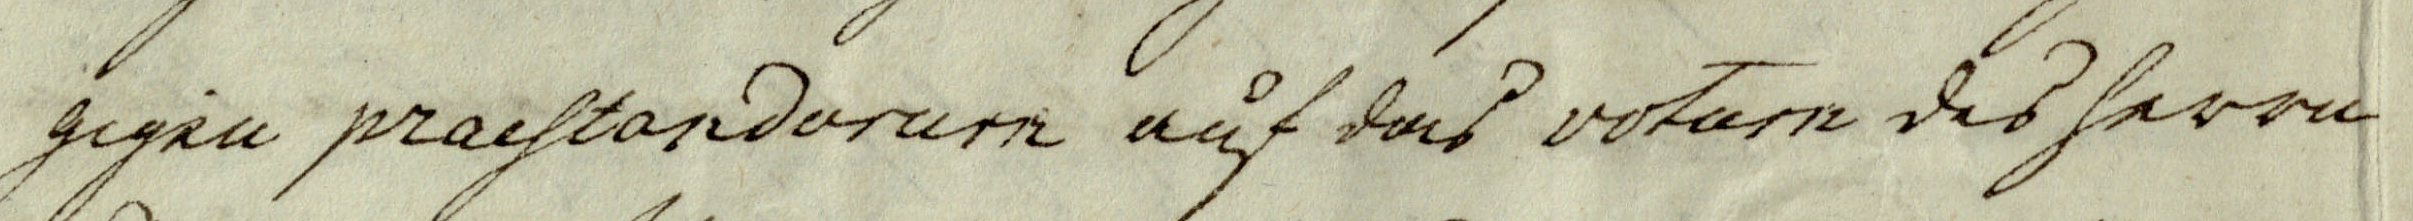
gigen praestandorum auf das votum des Herrn
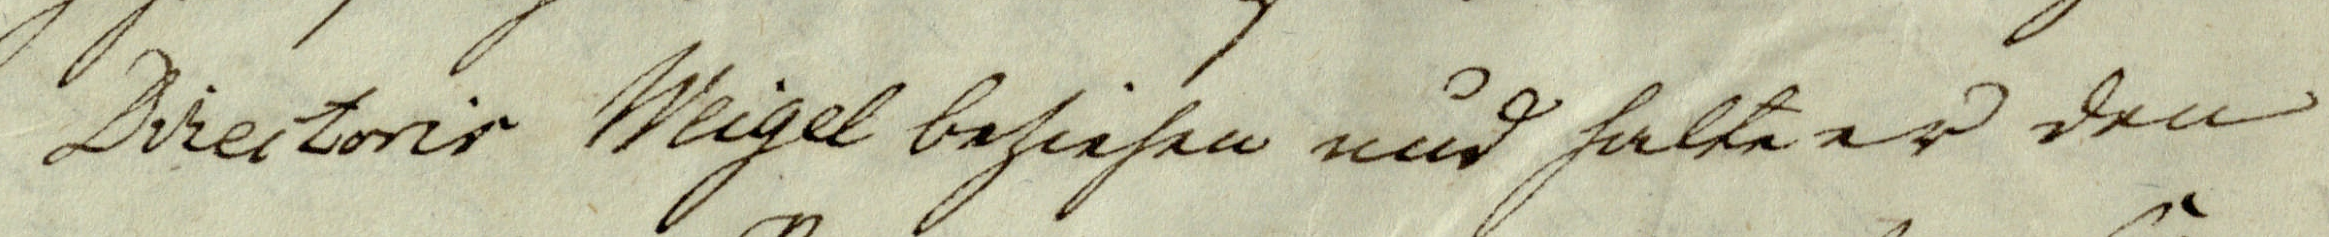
Directoris Weigel beziehen und halte er den
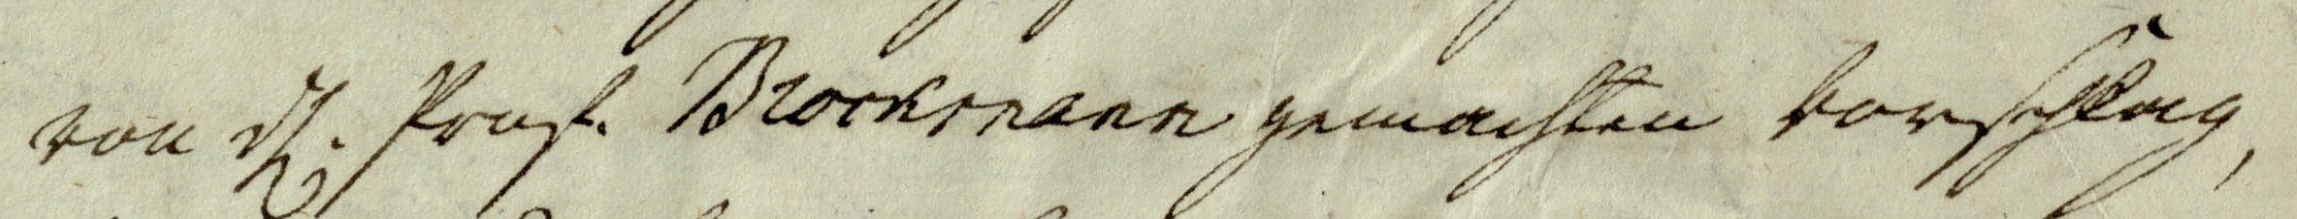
von dh. Prof. Brockmann gemachten Vorschlag,
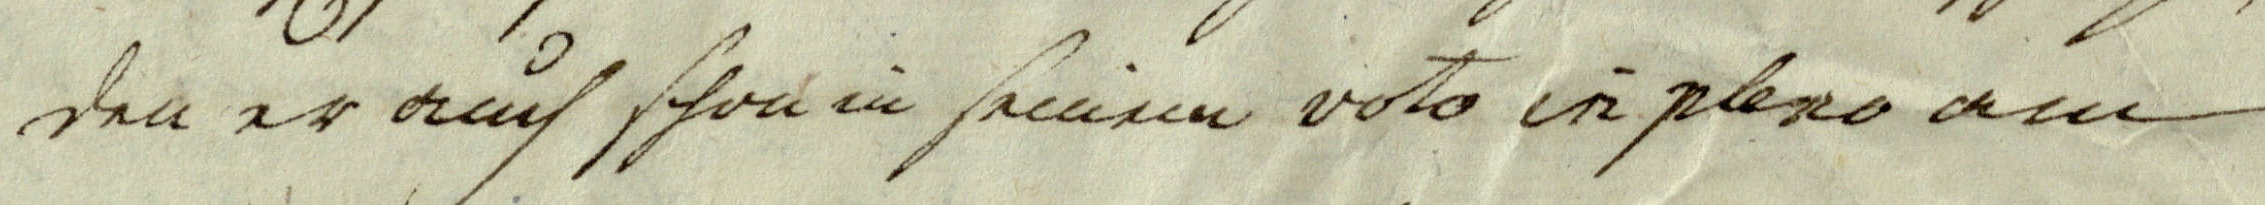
den er auch schon in seinem voto in pleno am
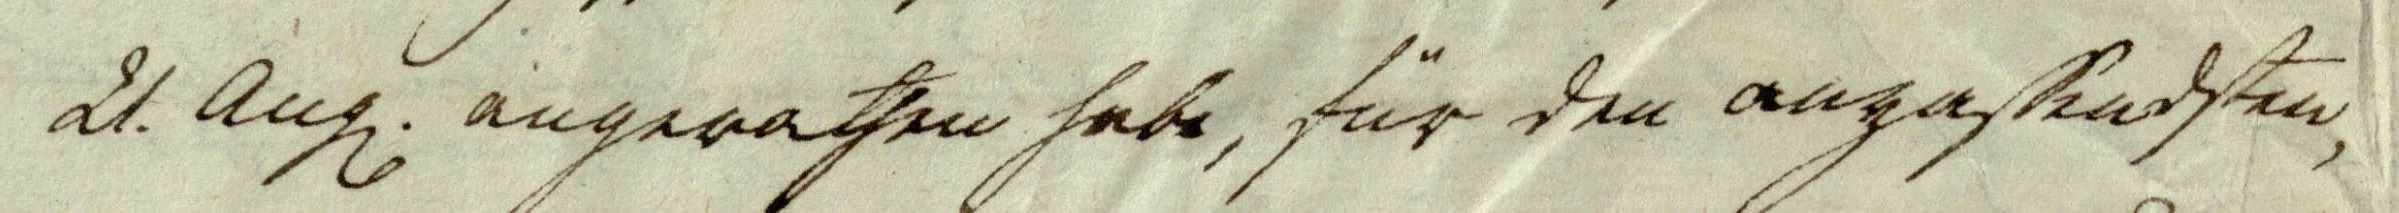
21. Aug. angerathen habe, für den anpassendsten,
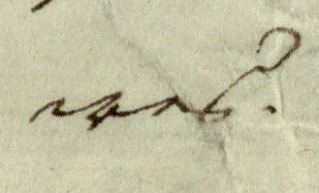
wes¬
